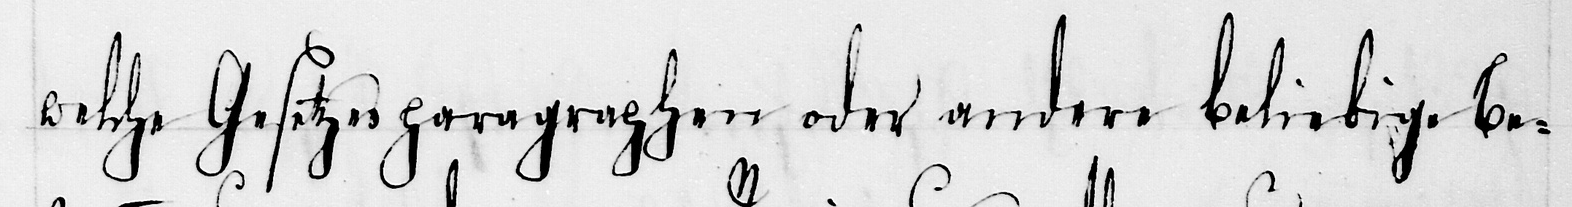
welche Gesetzesparagraphen oder andere beliebige Be¬
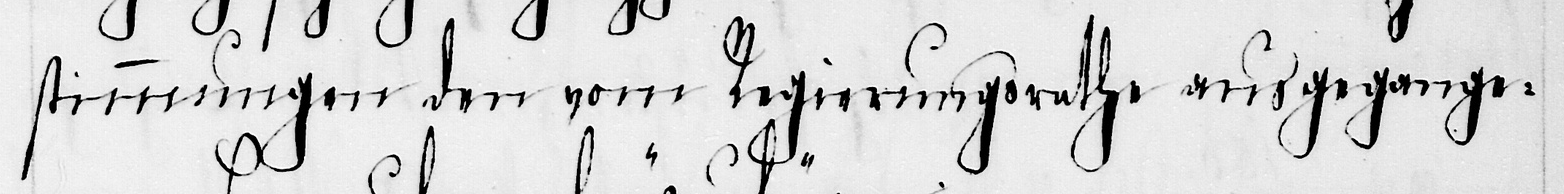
stimmungen den vom Regierungsrathe ausgegange¬
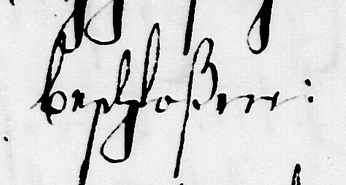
beschloßen:
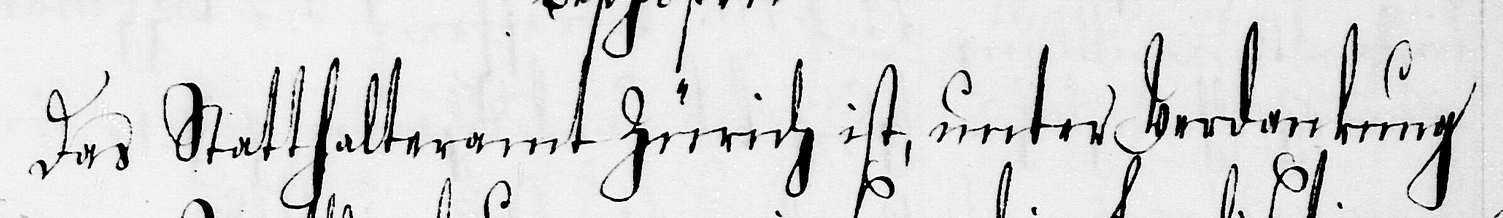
Das Statthalteramt Zürich ist, unter Verdankung
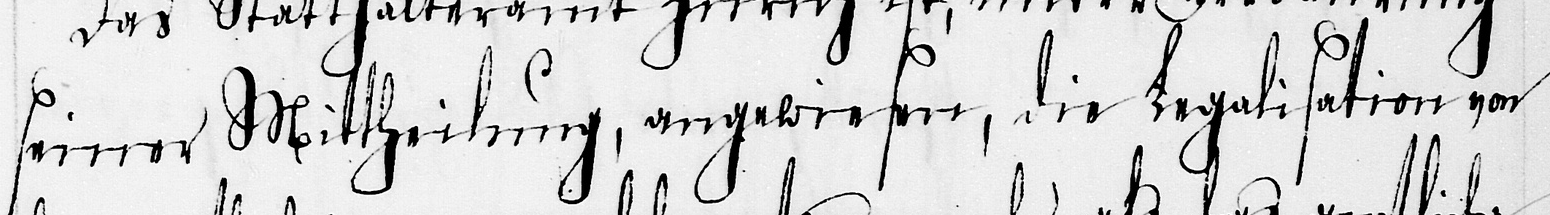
seiner Mittheilung, angewiesen, die Legalisation von
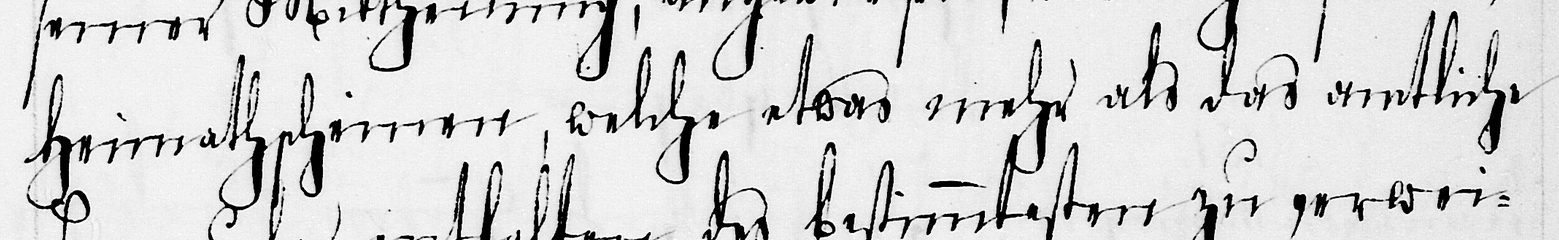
Heimathscheinen, welche etwas mehr als das amtliche
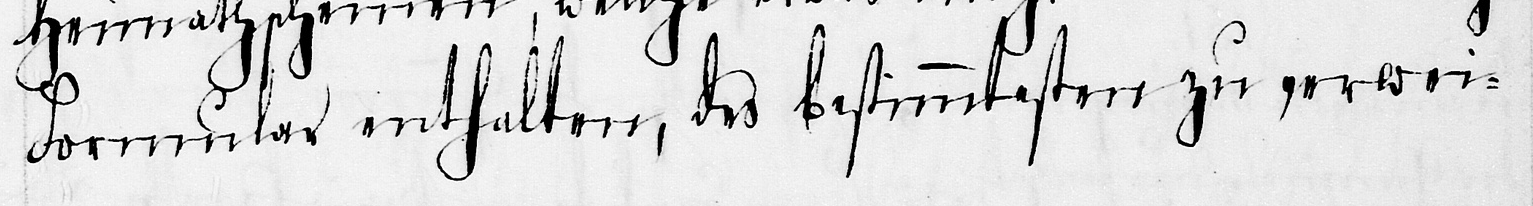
Formular enthalten, des bestimmtesten zu verwei¬
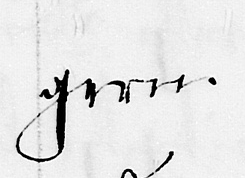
gern.
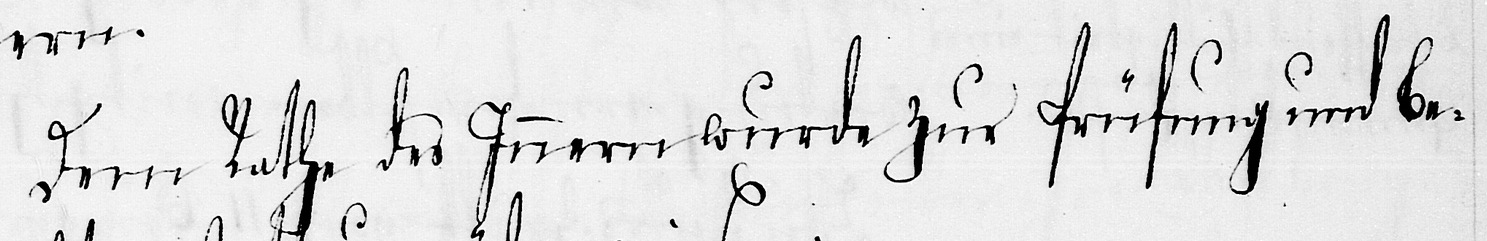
Dem Rathe des Innern wurde zur Prüfung und Be¬
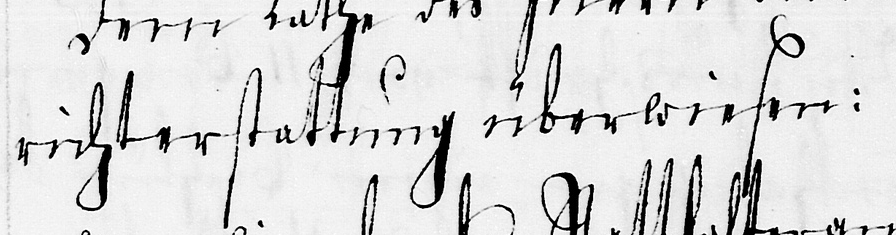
richterstattung überwiesen:
